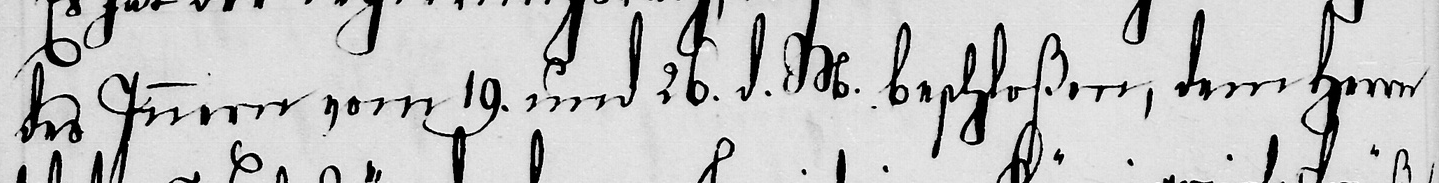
des Innern vom 19. und 26. d. M. beschloßen, dem Herrn
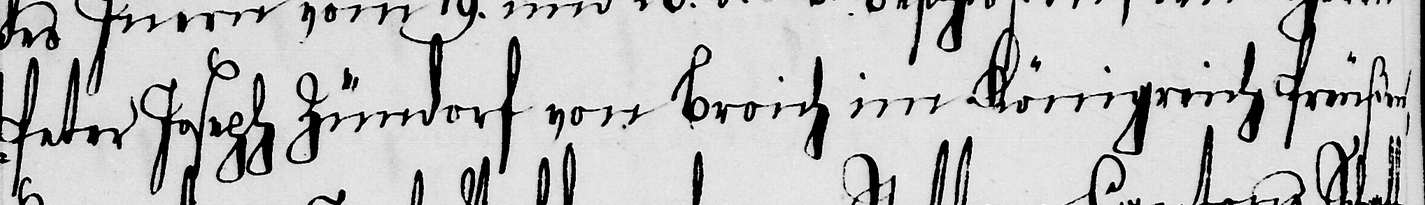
Peter Joseph Zündorf von Broich im Königreich Preuß¬
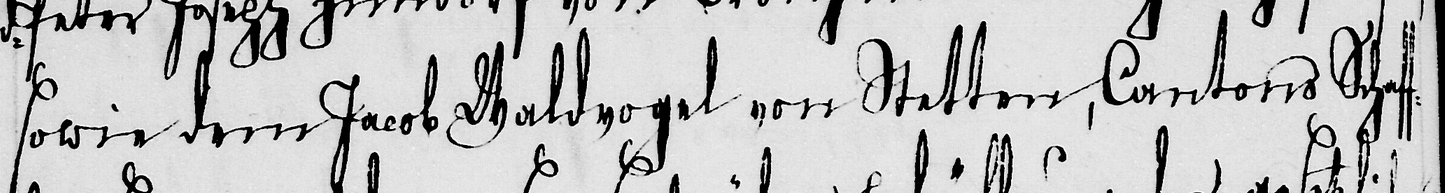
sowie dem Jacob Waldvogel von Stetten, Cantons Scha¬
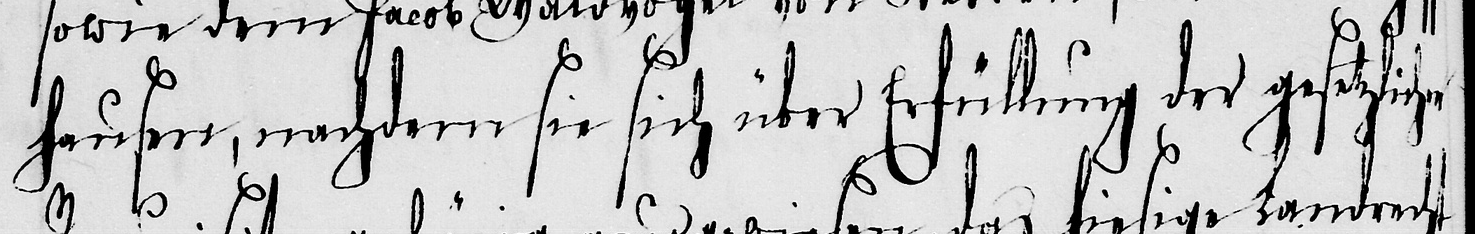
fhausen, nachdem sie sich über Erfüllung der gesetzl¬
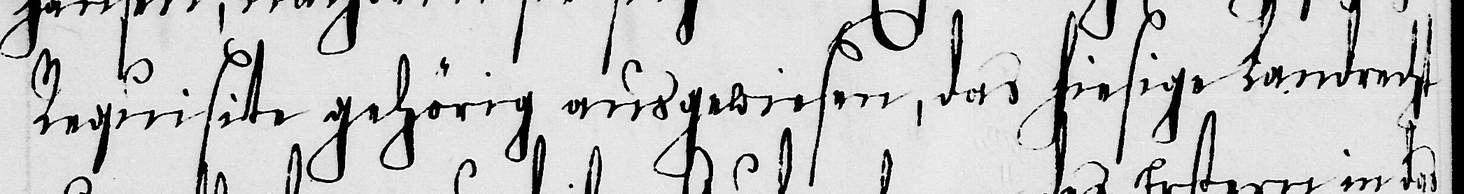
Requisite gehörig ausgewiesen, das hiesige Landrecht
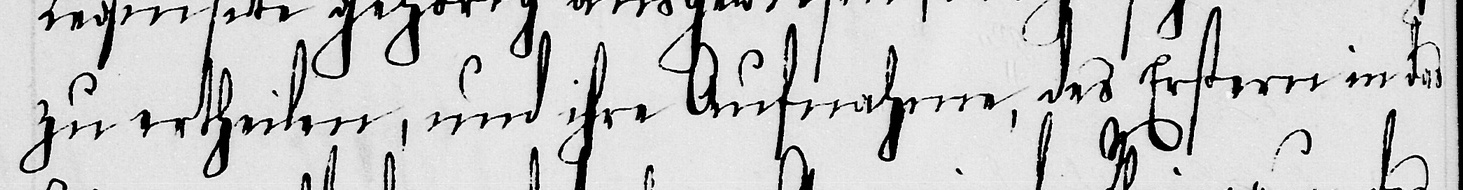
zu ertheilen, und ihre Aufnahme, des Erstern in das
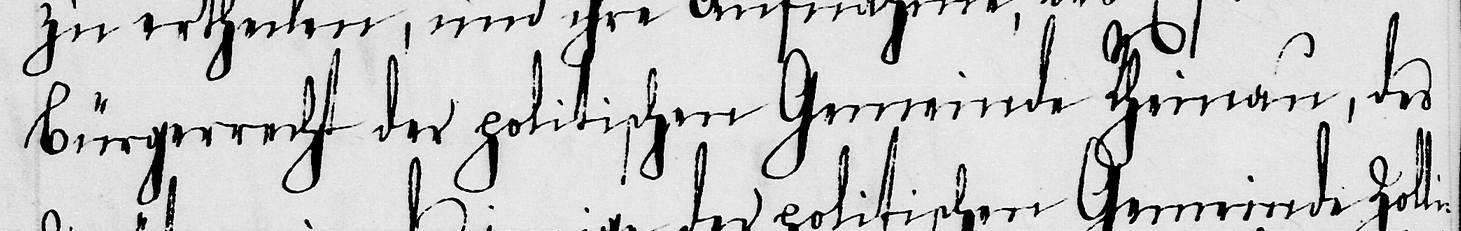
Bürgerrecht der politischen Gemeinde Rheinau, des
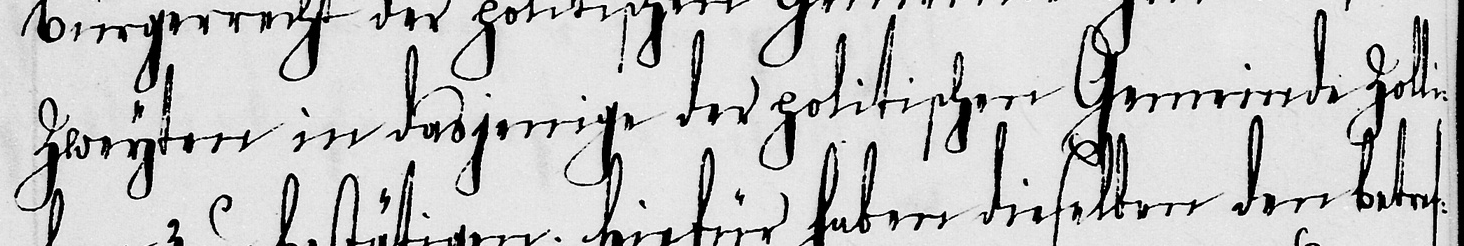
Zweyten in dasjenige der politischen Gemeinde Zol¬
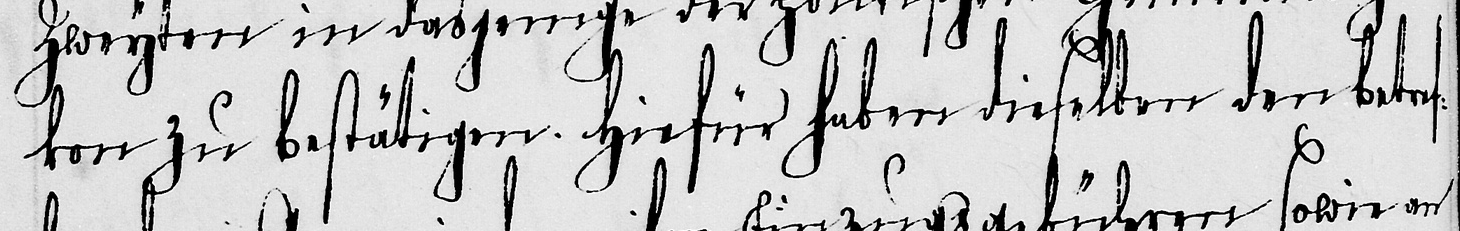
ikon zu bestätigen. Hiefür haben dieselben den betr¬
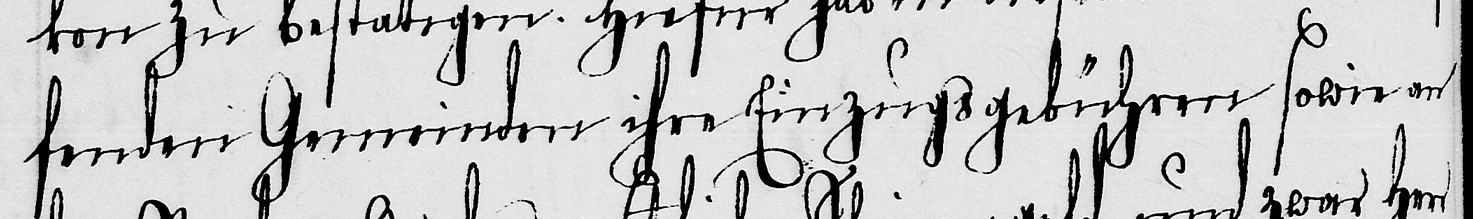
ffenden Gemeinden ihre Einzugsgebühren sowie an
